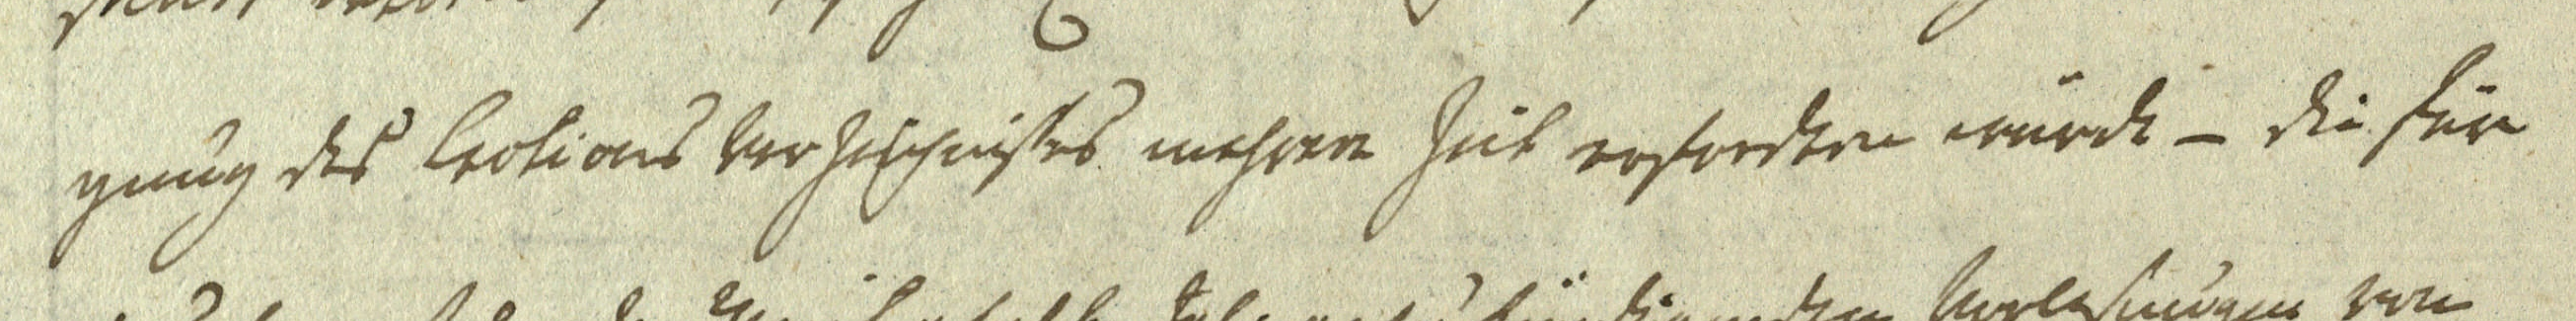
gung des Lections Verzeichnisses mehrere Zeit erfordern würde - die für
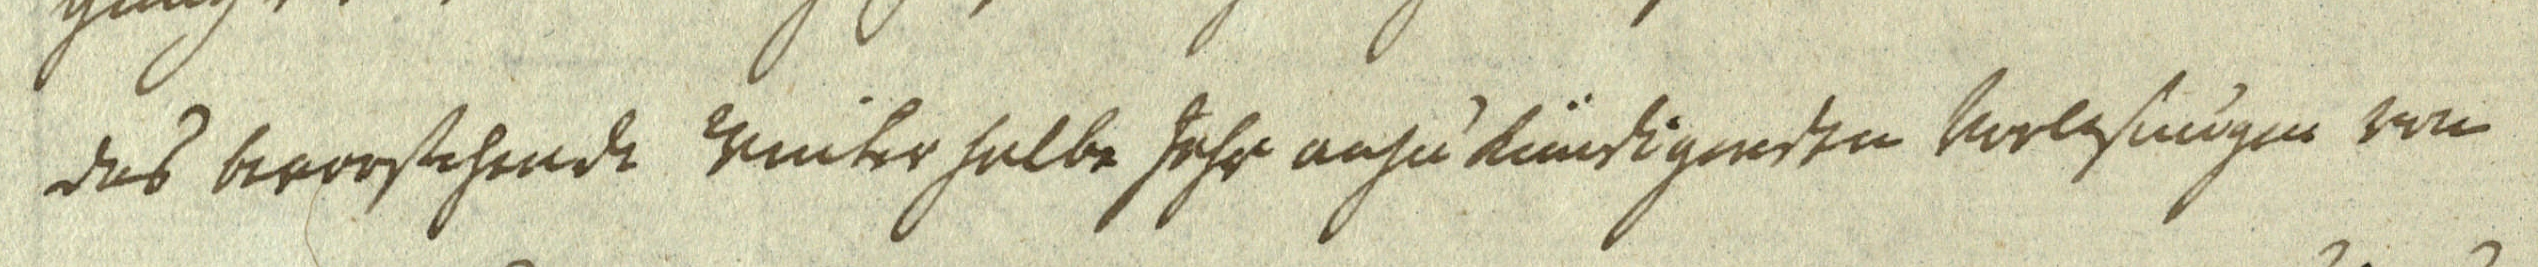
das bevorstehende Winterhalbe Jahr anzukündigenden Vorlesungen von
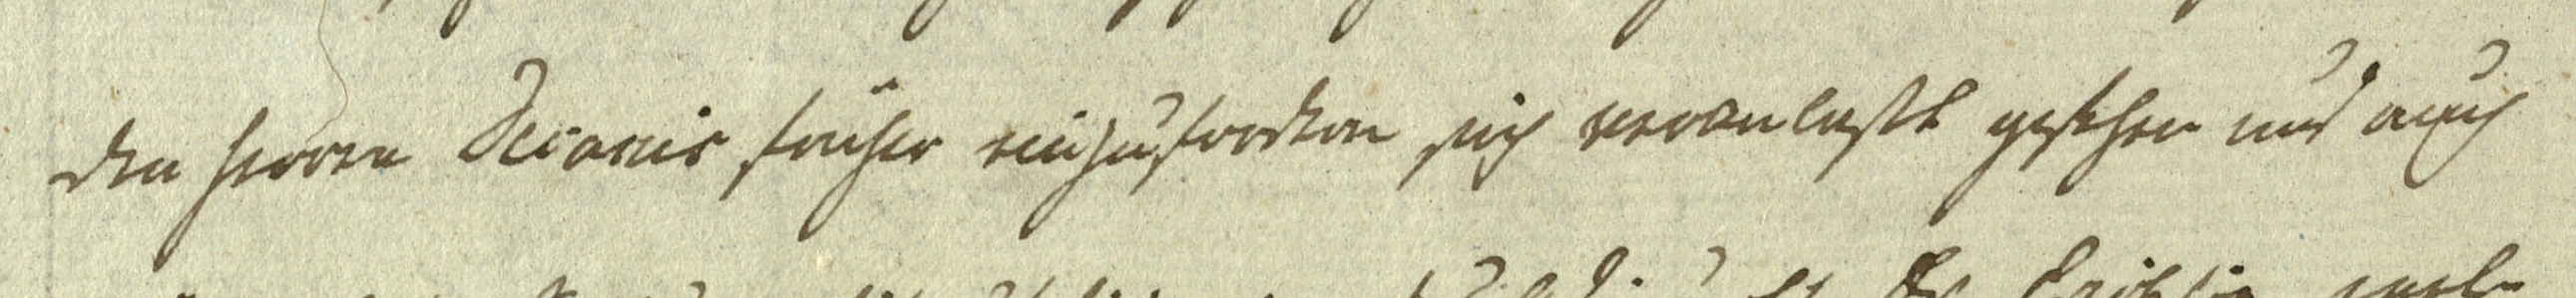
den Herren Decanis früher einzufordern sich veranlaßt gesehen und auch
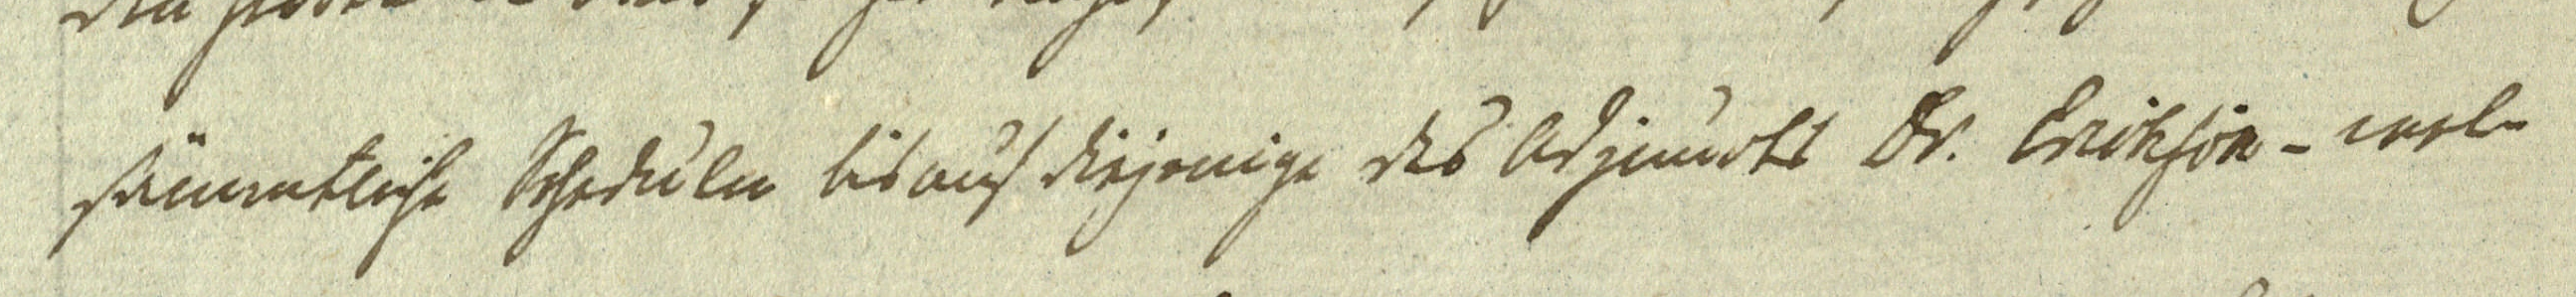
sämmtliche Scheduln des auf diejenige des Adjuncts Dr. Erichson - wel¬
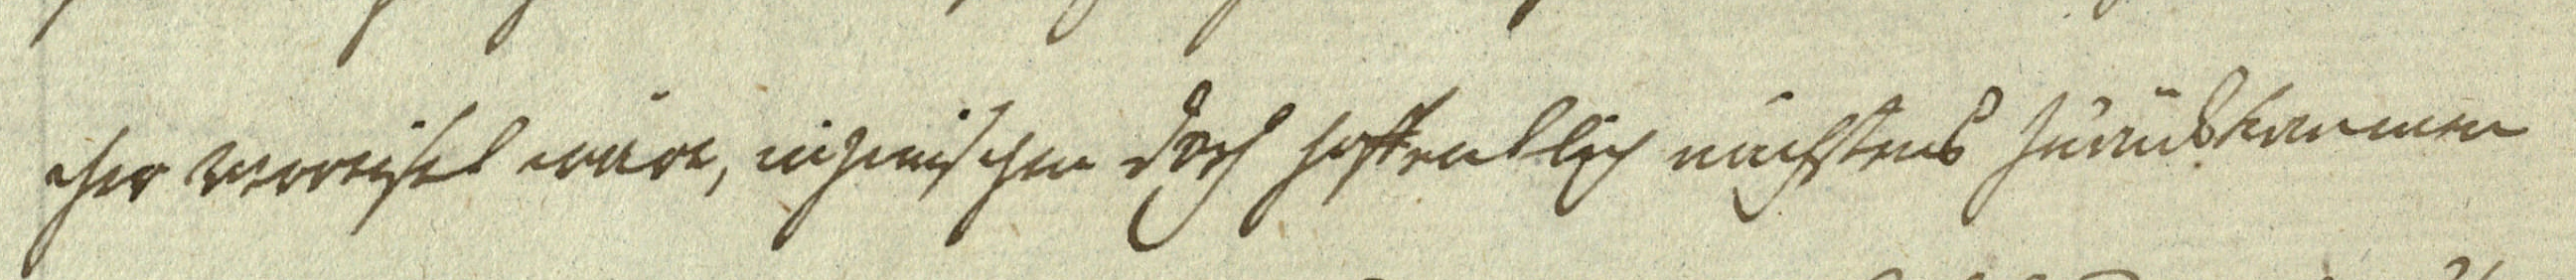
cher verreiset wäre, inzwischen doch hoffentlich nächstens zurückkommen
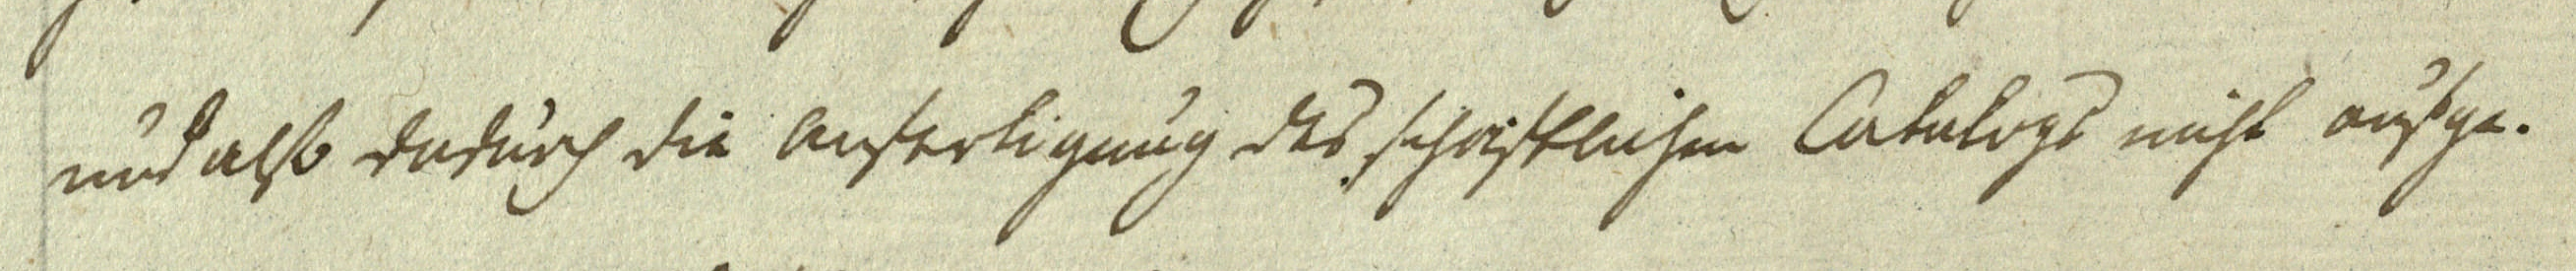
und also dadurch die Anfertigung des schriftlichen Catalogs nicht aufge¬
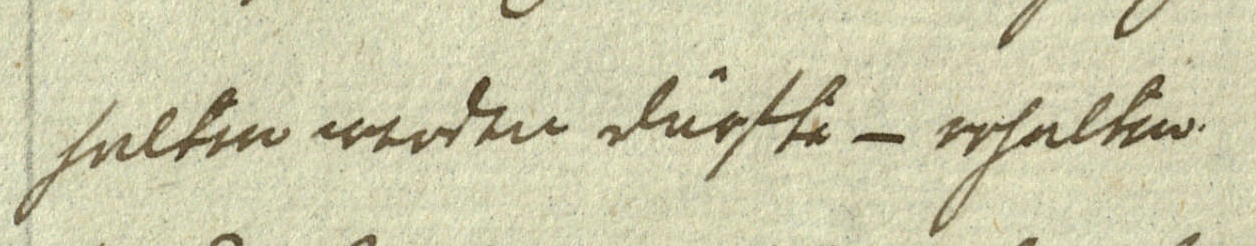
halten werden dürfte - erhalten.
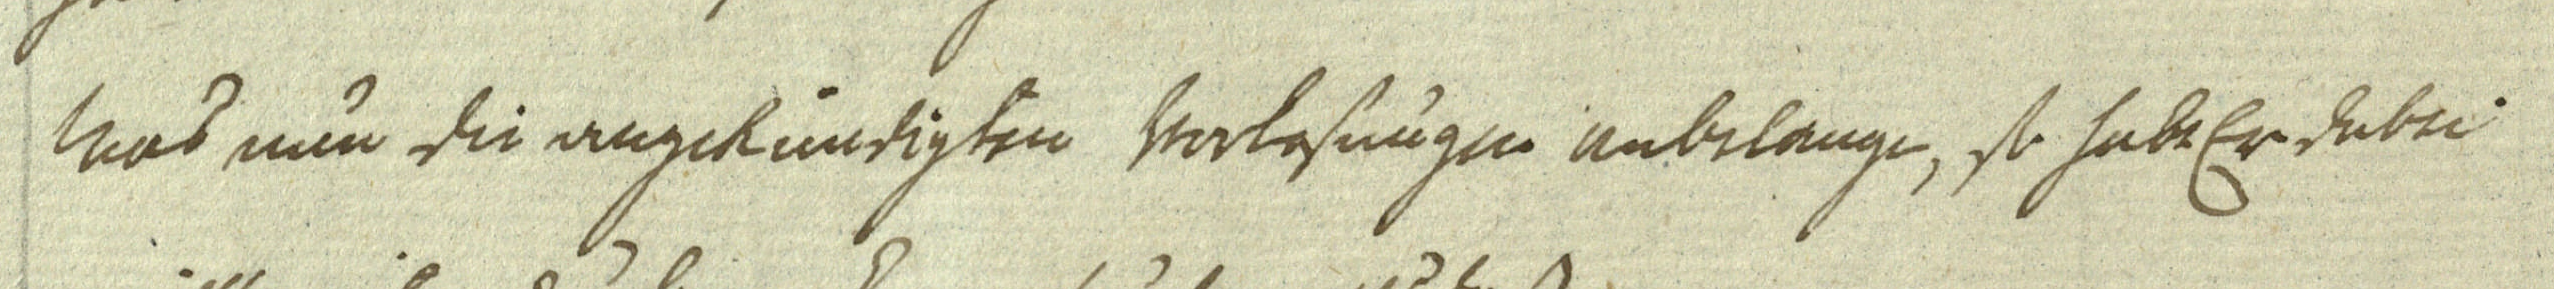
Was nun die angekündigten Vorlesungen anbelange, so habe Er dabei
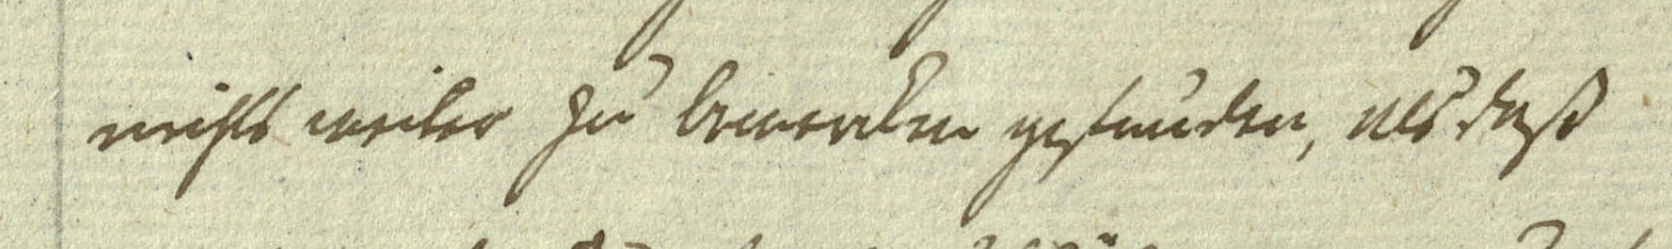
nichts weiter zu bewerken gefunden, als daß
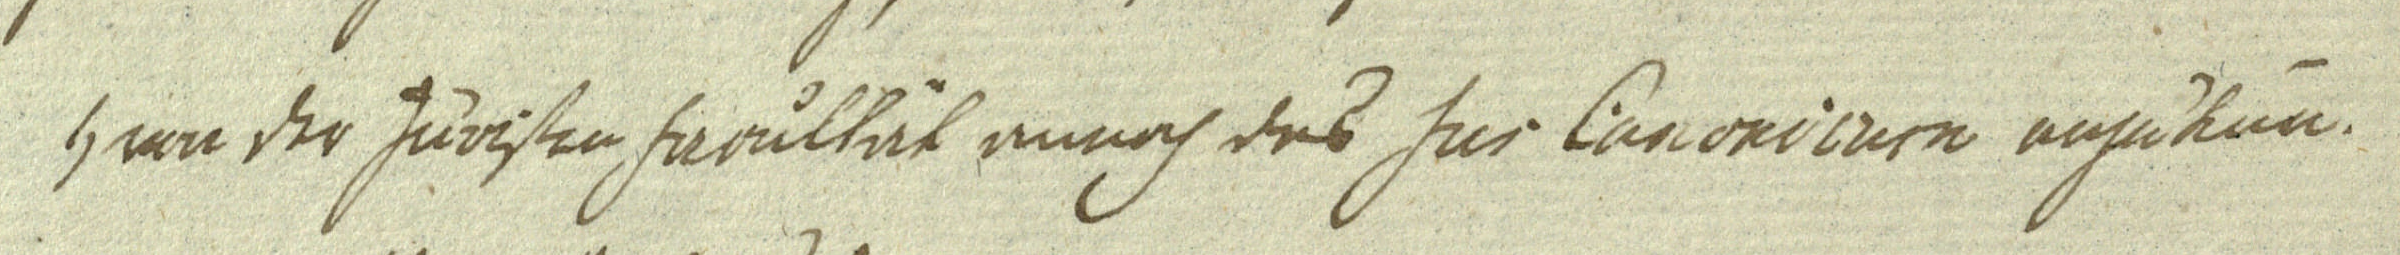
1, von der Juristen Facultät annoch das Jus Canonicum anzukün¬
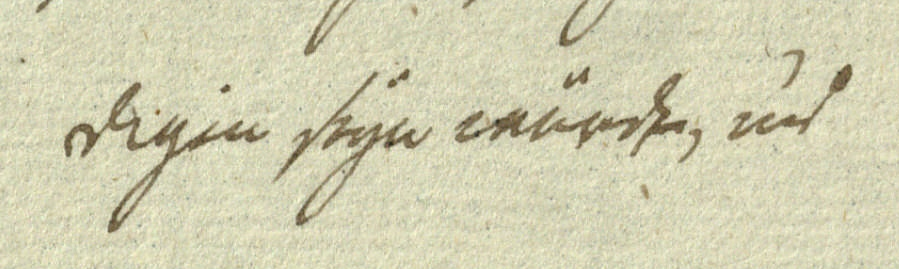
digen seÿn würde, und
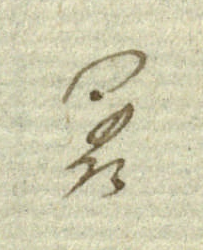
2,
